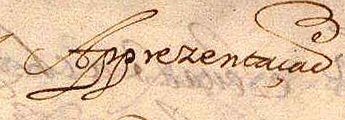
Apprezentaçaõ
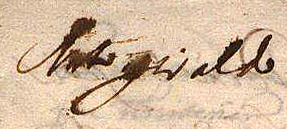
Anto giraldo
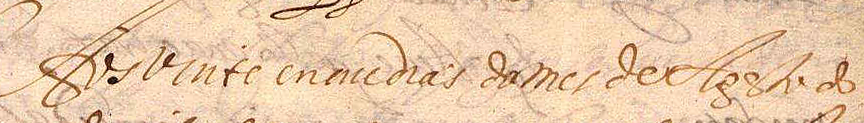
Aos vinte e noue dias do mes de Agosto do
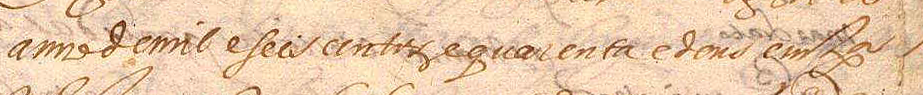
anno de mil e seiscentos e quarenta e dous em Lxa
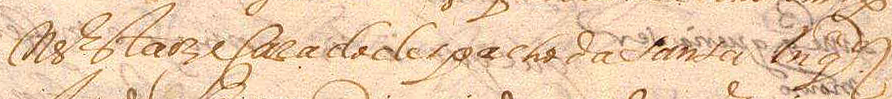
nos Estaos, e Caza do despacho da Santa Inq.çaõ
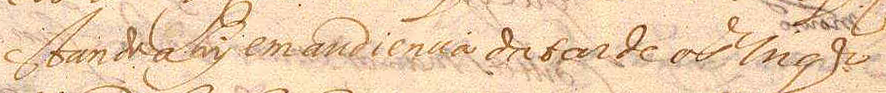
estando ahy em audiencia da tarde o sor Inqor
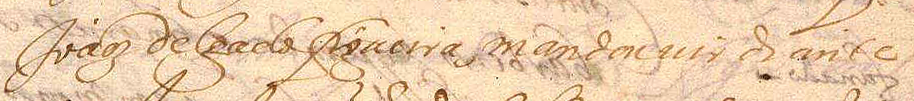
Joaõ delgado figueira, mandou uir diante
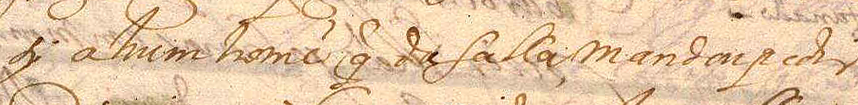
sy a hum homē q̄ da salla mandou pedir
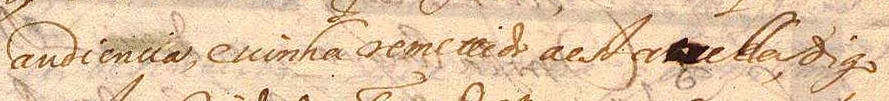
audiencia, e uinha remettido a esta _ella, digo
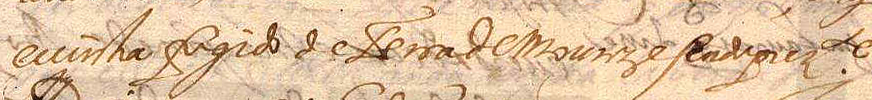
e uinha fogido de Terra de Mouros e sendo prez.te
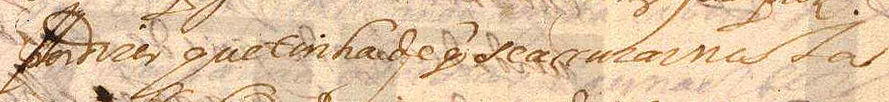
por dizer que tinha de q̄ se accuzar nesta
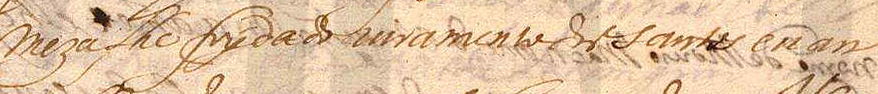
meza lhe foy dado iuramento dos santos euan
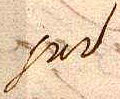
jur
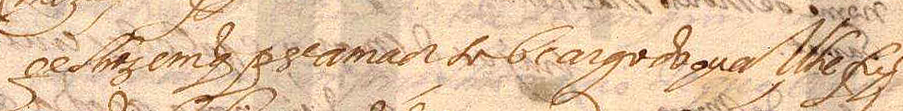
gelhos em q̄ pos a maõ sob cargo do qual lhe foy
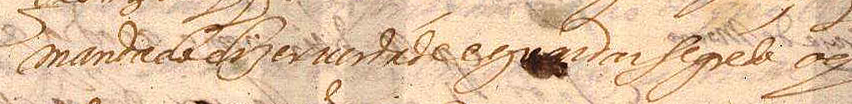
mandado dizer uerdade e guardar segredo o q̄
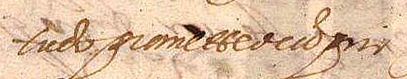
tudo prometteo cūprir
